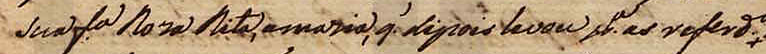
sua f.a Roza Rita, amazia, q̄ dipois levou p.a as referd.as
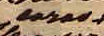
cazas
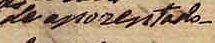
de apozentado
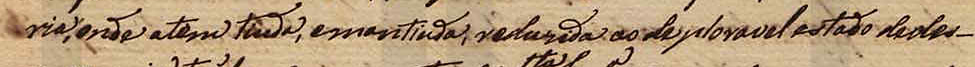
ria, onde a tem tiuda, e mantiuda, reduzida ao deploravel estado de des
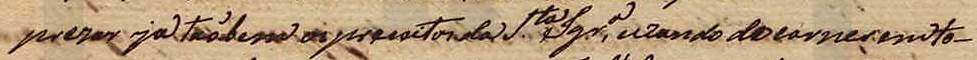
prezar ja taõbem os preceitos da S.ta Igr.a, uzando de carnes: em to
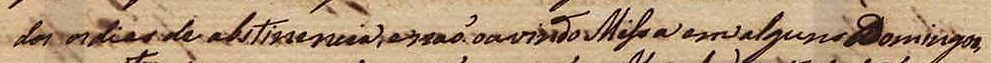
dos os dias de abstinencia, e naõ ouvindo Missa em alguns Domingos,
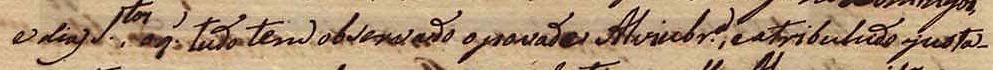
e dias s.tos, o q̄ tudo tem observado o povo de Alviubr.a, e atribuhido justa
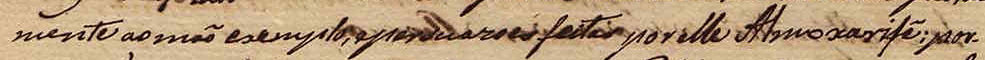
mente ao mao exemplo, e persuazoes feitas por elle Almoxarife: por
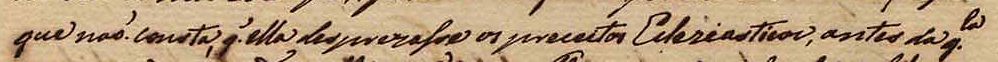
que naõ consta, q̄ ella desprezasse os preceitos Ecleziasticos, antes daq.la
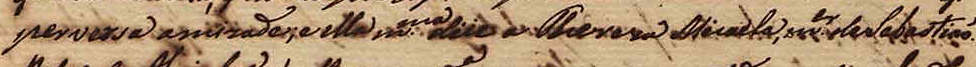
perversa amizade, e ella m.ma dice a Thereza Micaella, m.er de Sebastiaõ.
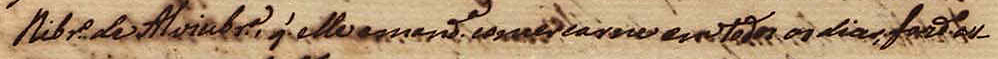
Ribr.o de Alviubr.a q̄ elle a mand.a comer carne em todos os dias, fazd.o as
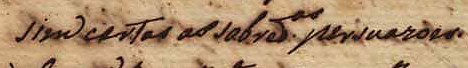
sim certas as sobredas persuazoes.
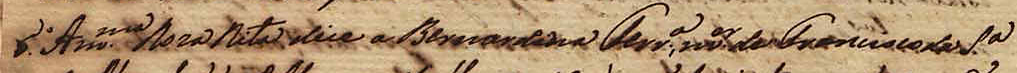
5.o A m.ma Roza Rita dice a Bernardina Ferr.a, m.er de Francisco da S.a
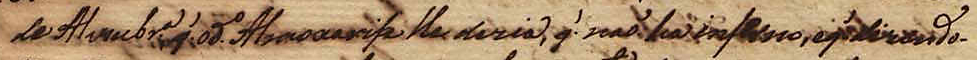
de Alviubr.a, q̄ o d.o Almoxarife lhe dezia, q̄ naõ ha inferno, e q̄ dizendo
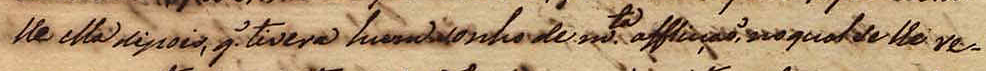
lhe ella dipois, q̄ tivera hum sonho de m.ta afflicçaõ, no qual se lhe re
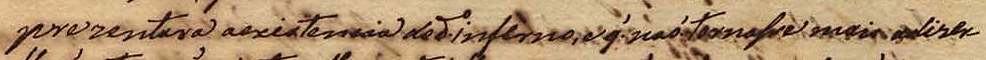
prezentara a existencia do d.o inferno, e q̄ naõ tornasse mais a dizer
